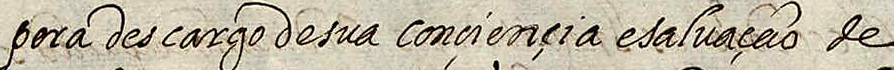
pera descargo de sua conçiençia e salvação de
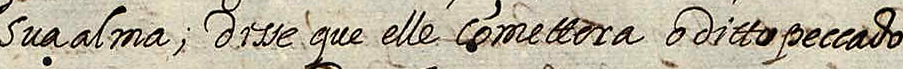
sua alma; disse que elle cōmettera o ditto peccado
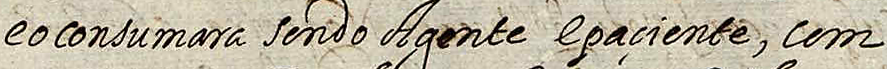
e o consumara sendo Agente e paçiente, com
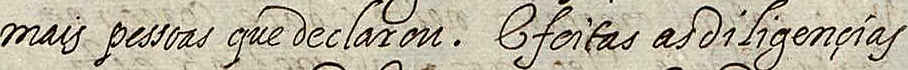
mais pessoas que declarou. E feitas as diligençias
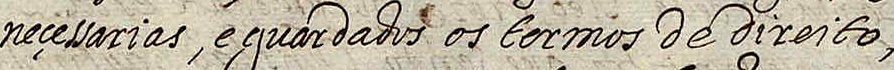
neçessarias, e guardados os termos de direito,
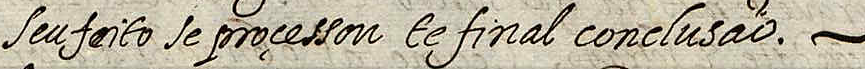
seu feito se proçessou te final conclusão.
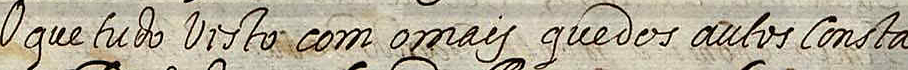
O que tudo visto com o mais que dos autos consta
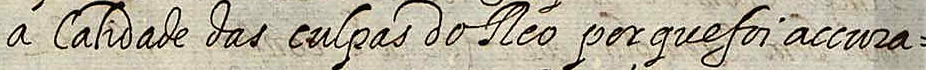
a Calidade das culpas do Reo por que foi accuza
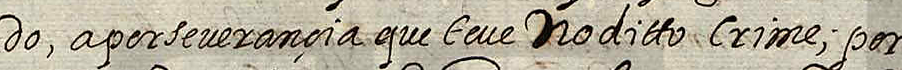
do, a perseverançia que teve no ditto crime; por
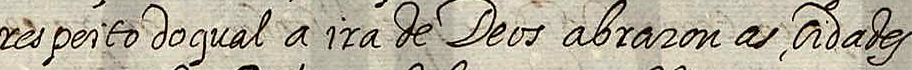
respeito do qual a ira de Deos abrazou as çidades
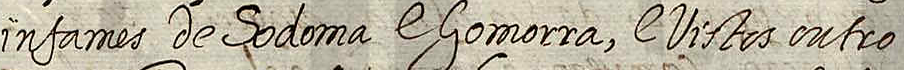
infames de Sodoma e Gomorra, e vistos outro
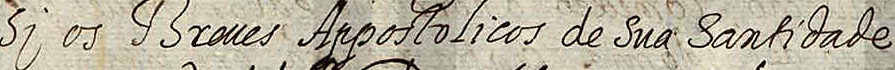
sj os Breves Appostolicos de Sua Santidade
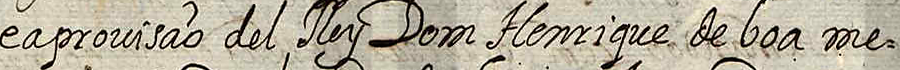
e a provisão del Rey Dom Henrique de boa me
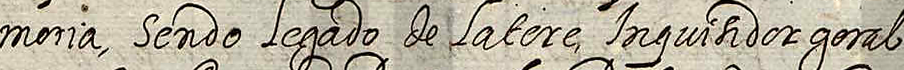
moria, sendo Legado de Latere, Inquisidor geral
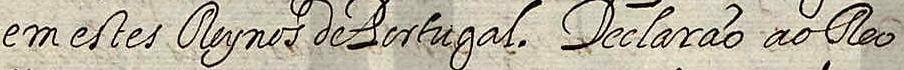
em estes Reynos de Portugal. Declarão ao Reo
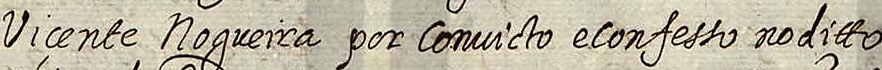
Vicente Nogueira por convicto e confesso no ditto
